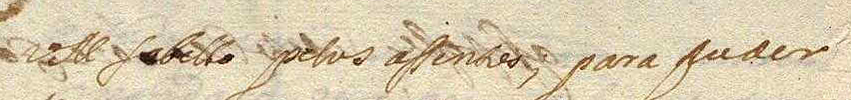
V M sabello pelos assentos, para puder
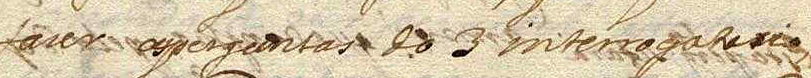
fazer as perguntas do 3 interrogatorio,
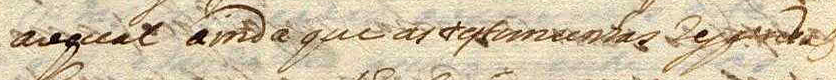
ao qual ainda que as testemunhas respondaõ
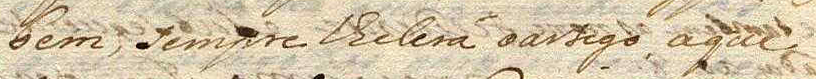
bem, sempre lhe lerá o artigo a que
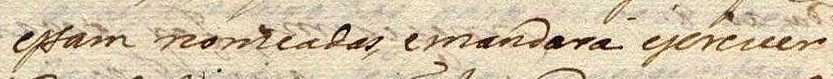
estam nomeadas, e mandará escreuer
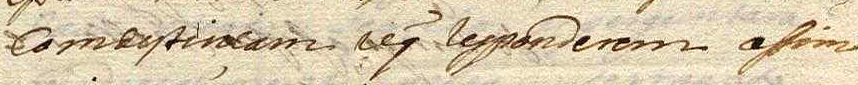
com destinçam o q̄ responderem assim
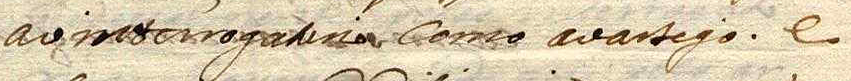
ao interrogatorio como ao artigo. E
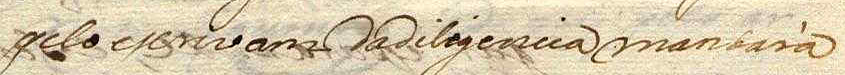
pelo escrivam da diligencia mandará
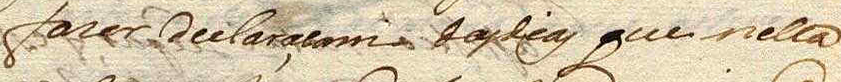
fazer declaraçam dos dias que nella
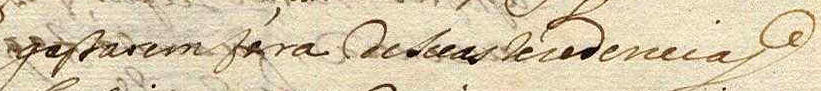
gastarem fora de suas rezedencias
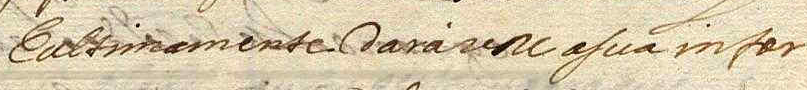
E ultimamente dará V M a sua infor
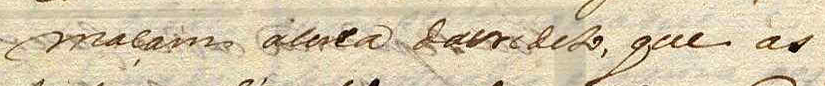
maçam acerca da credito, que as
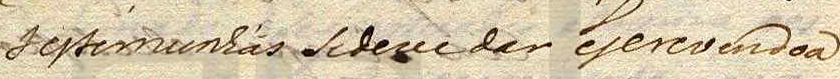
testemunhas se deue dar escrevendoa
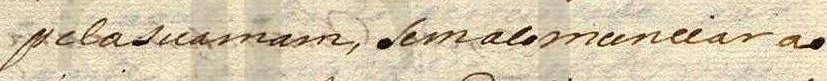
pela sua mam, sem a comunicar ao
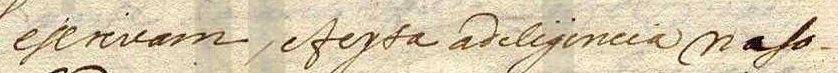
escrivam, e feyta a deligencia na so
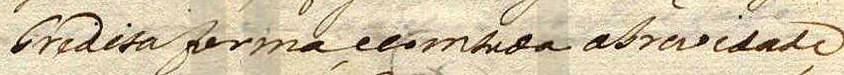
bredita forma, e com toda a brevidade
